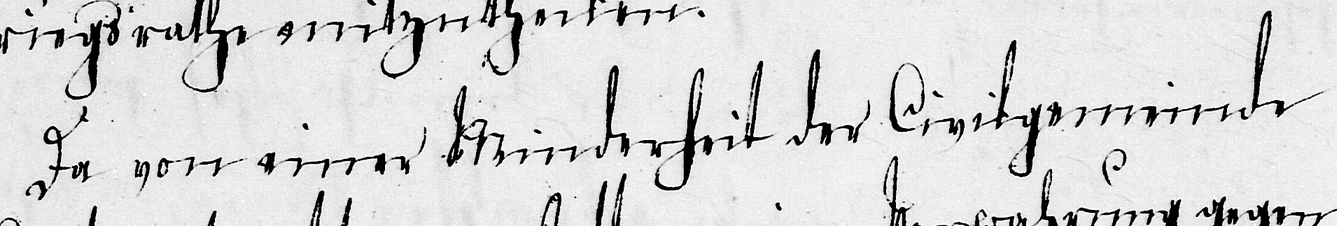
Da von einer Minderheit der Civilgemeinde
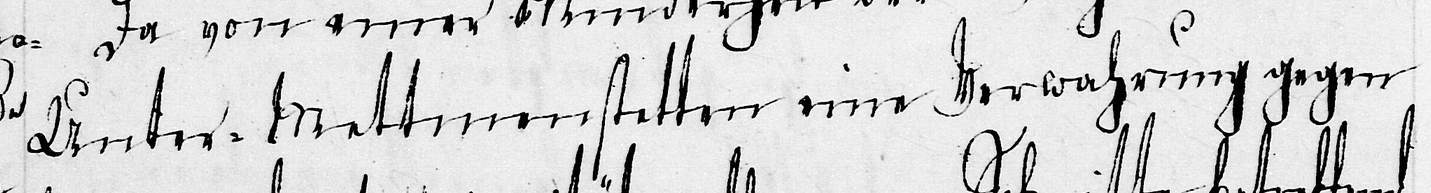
Unter-Mettmenstetten eine Verwahrung gegen
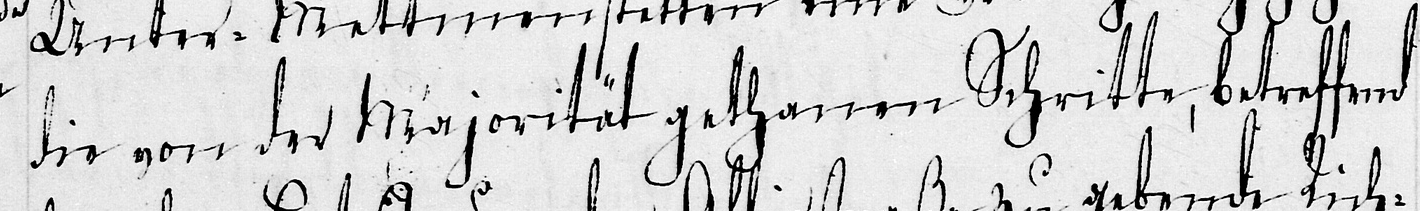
die von der Majorität gethanen Schritte, betreffe¬
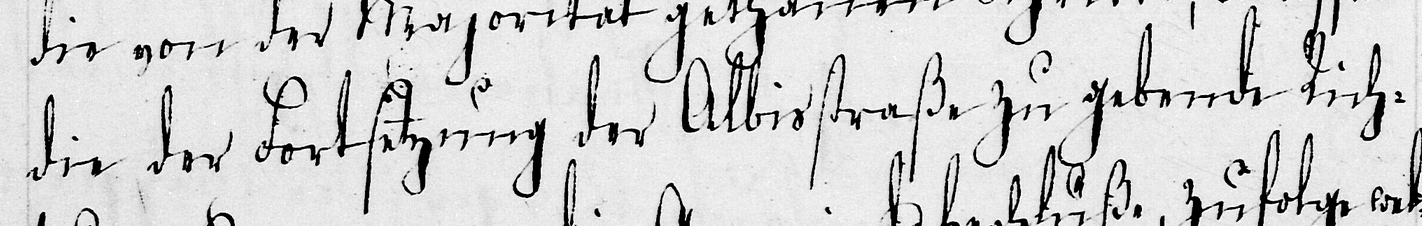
die der Fortsetzung der Albisstraße zu gebende Rich¬
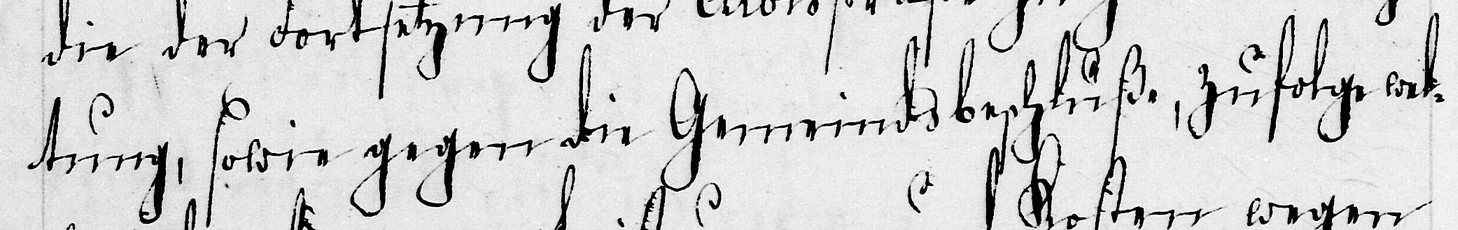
tung, sowie gegen die Gemeindsbeschlüße, zufolge we¬
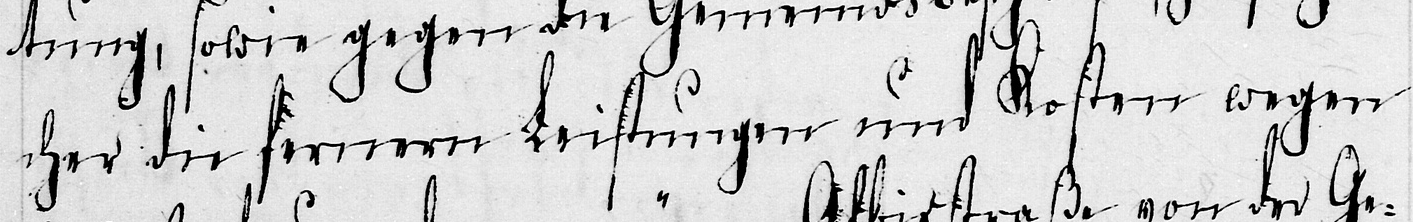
cher die fernern Leistungen und Kosten wegen
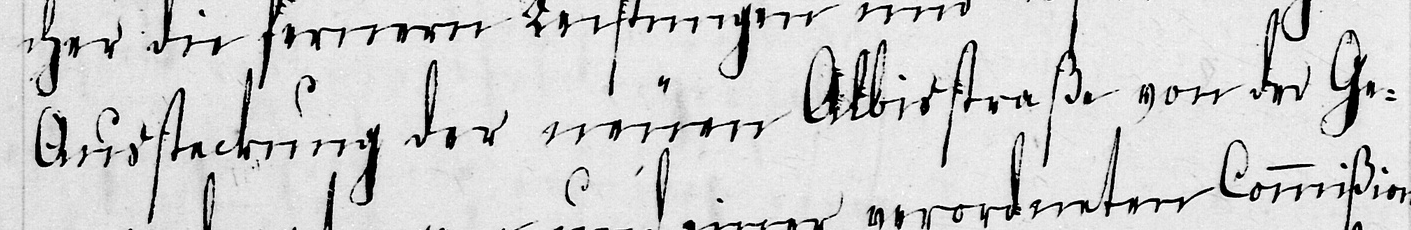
Aussteckung der neuen Albisstraße von der Ge¬
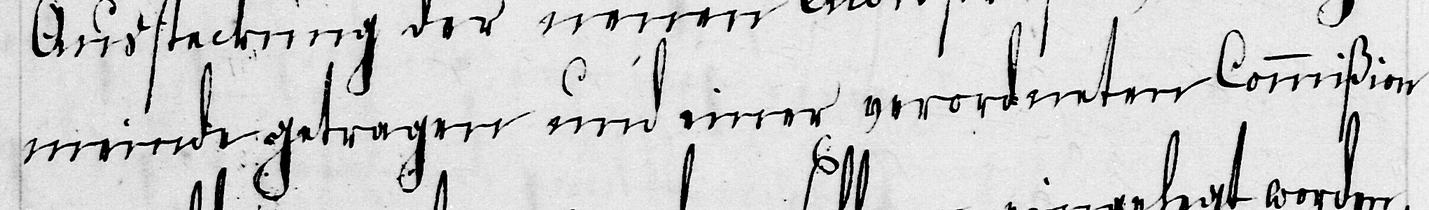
meinde getragen und einer verordneten Commißion
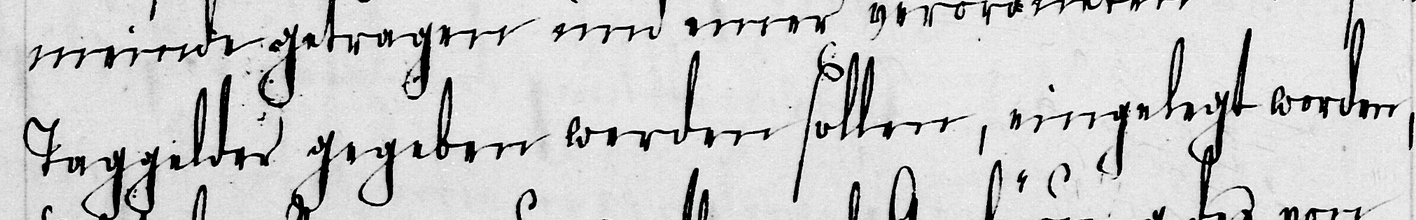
Taggelder gegeben werden sollen, eingelegt worden,
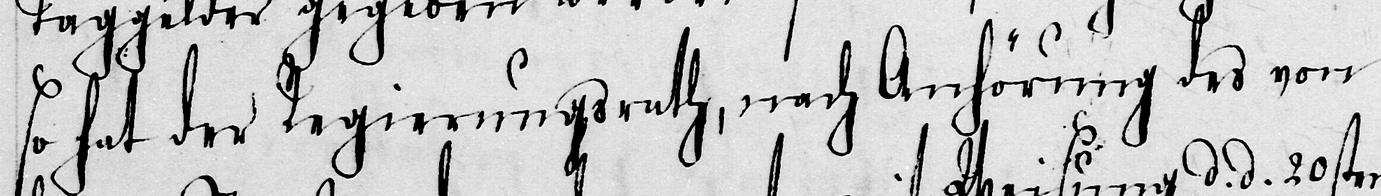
so hat der Regierungsrath, nach Anhörung des von
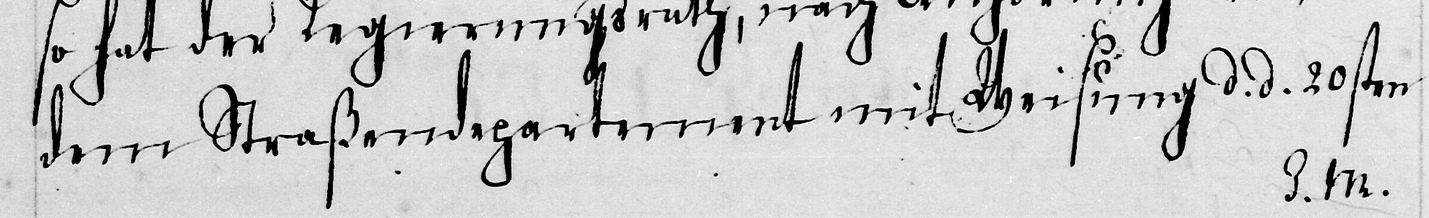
dem Straßendepartement mit Weisung d. d. 20sten
